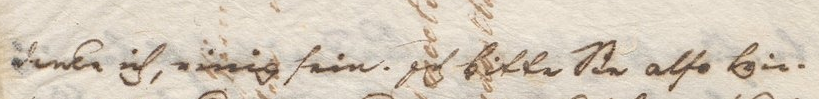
denke ich, einig sein. Ich bitte Sie also wie-
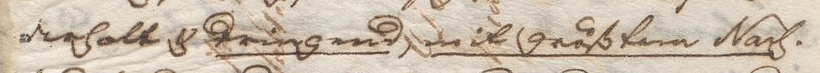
derholt & dringend, mit größtem Nach-
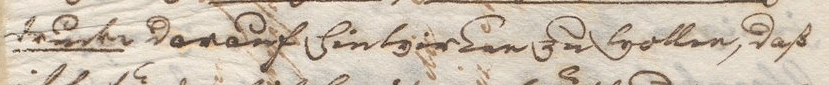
drucke darauf hinwirken zu wollen, daß
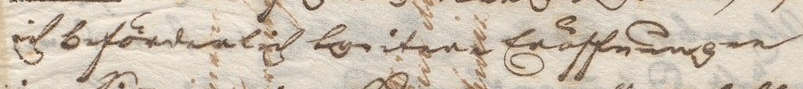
ich beförderlich weitere Eröffnungen
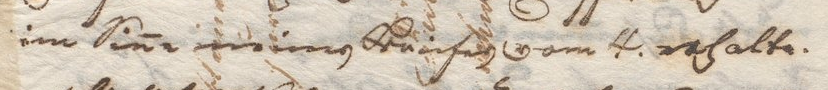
im Sinne meines Briefes vom 4. erhalte.
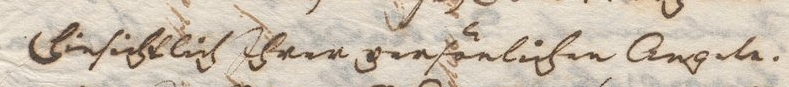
Hinsichtlich Ihrer persönlichen Angele-
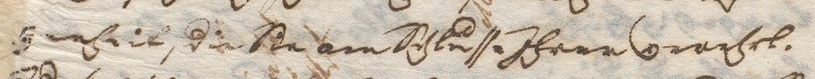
genheit, die Sie am Schlusse Ihrer verehrl.
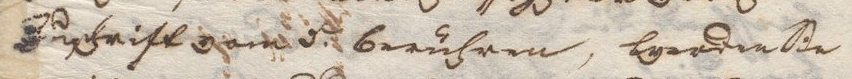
Zuschrift vom 5. berühren, werden Sie
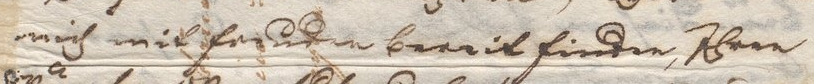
mich mit Freunden bereit finden, Ihren
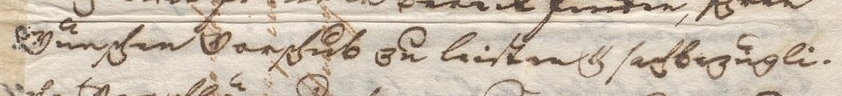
Wünschen Vorschub zu leisten & sachbezügli-
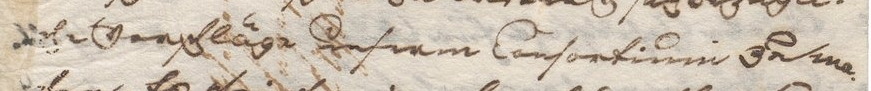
che Vorschläge unserm Consortium zu ma-
